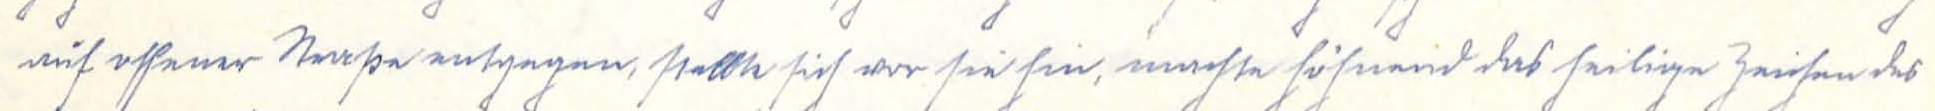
auf offener Straße entgegen, stellte sich vor sie hin, machte höhnend das heilige Zeichen des
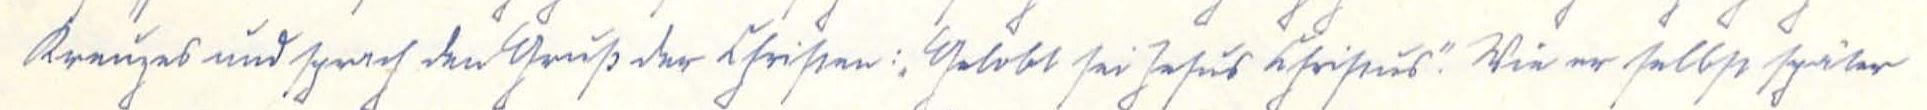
kreuzes und sprach den Gruß der Christen: "Gelobt sei Jesus Christus". Wie er selbst später
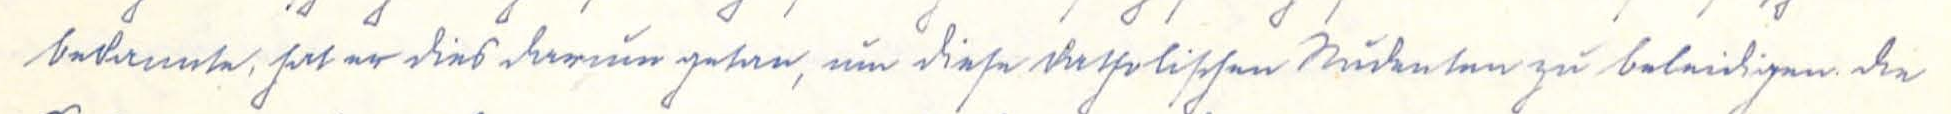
bekannte, hat er dies darum getan, um diese katholischen Studenten zu beleidigen. Die
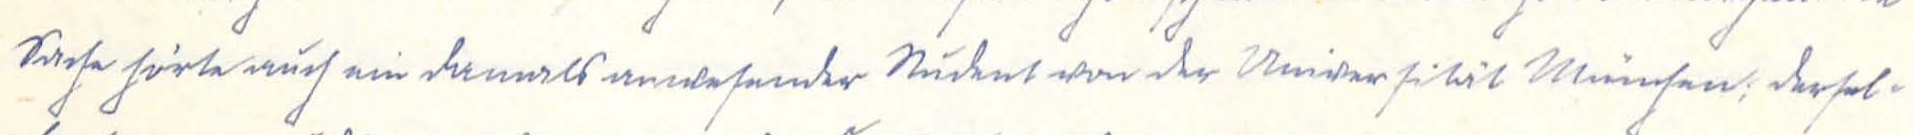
Sache hörte auch ein damals anwesender Student von der Universität München; dersel-
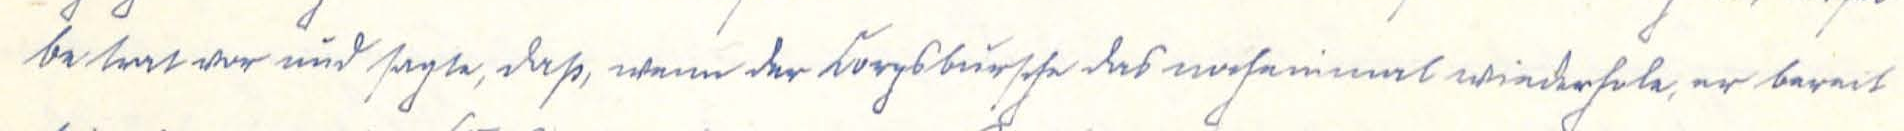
be trat vor und sagte, daß, wenn der Corpsbursch das nocheinmal wiederhole, er bereit
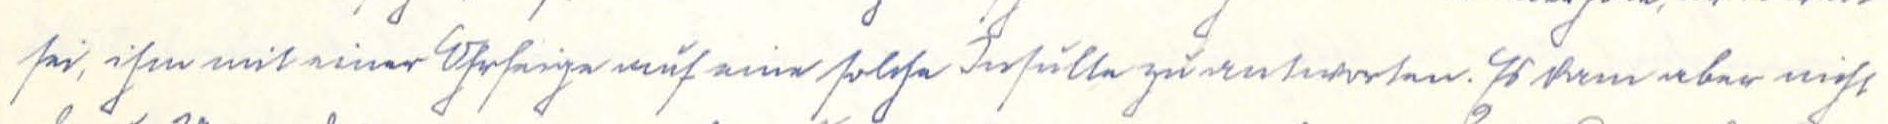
sei ihn mit einer Ohrfeige auf eine solche Insulte zu anworten. Es kam aber nicht
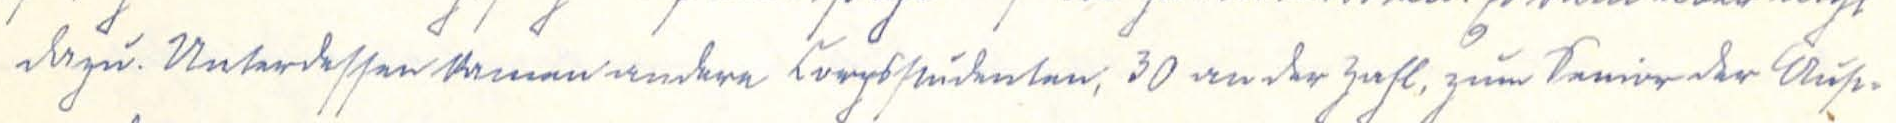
dazu. Unterdessen kamen andere Corpsburschen, 30 an der Zahl, zum Senior der Aust-
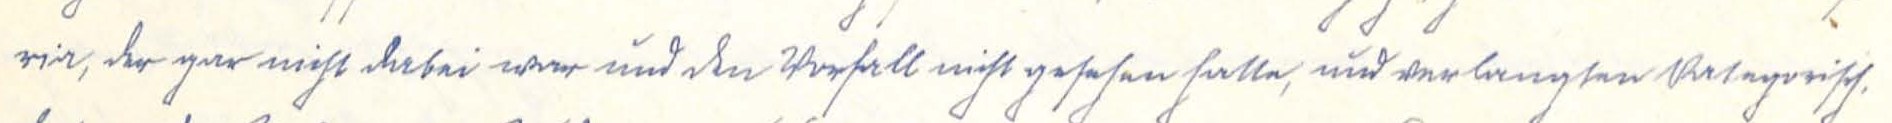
ria, der gar nicht dabei war und den Vorfall nicht gesehen hatte, und verlangten kategorisch,
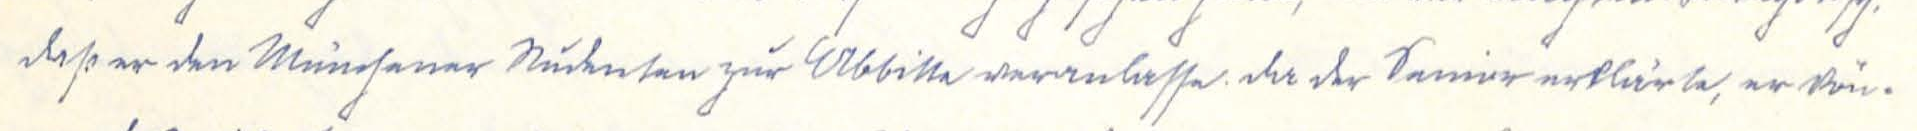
daß er den Münchener Studenten zur Abbitte veranlasse. Da der Senior erklärte, er kön-
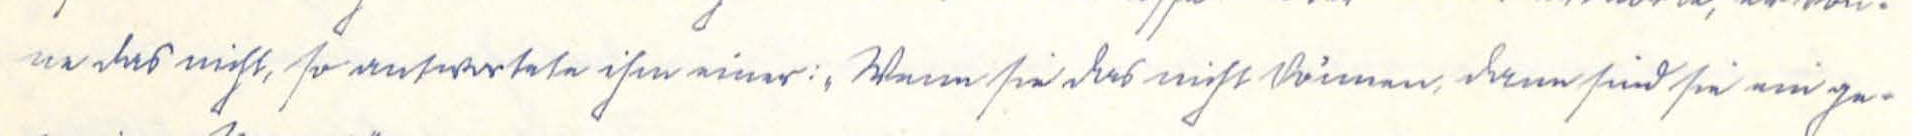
ne das nicht, so antwortete ihm einer: "Wenn sie das nicht können, dann sind sie ein ge-
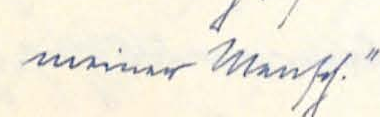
meiner Mensch."
